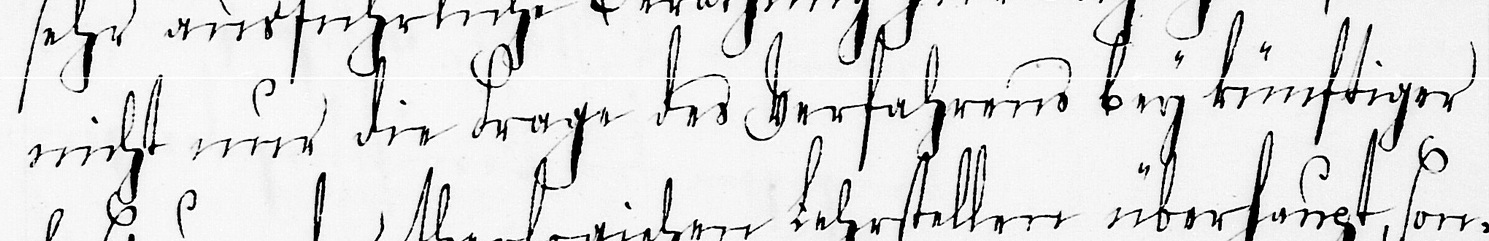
nicht nur die Frage des Verfahrens bey künftiger
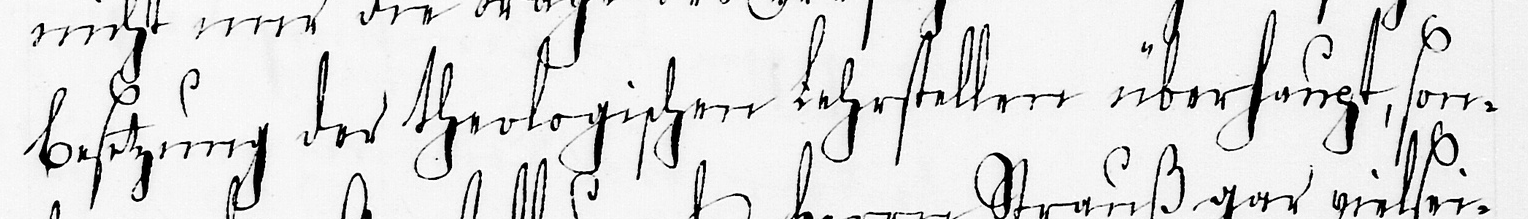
Besetzung der theologischen Lehrstellen überhaupt, son¬
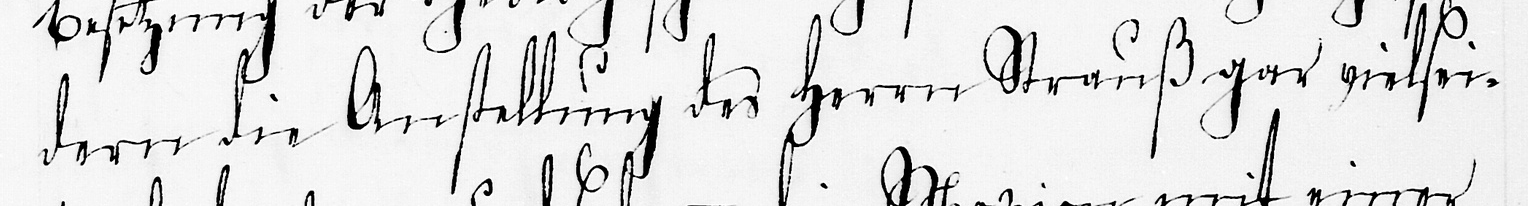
dern die Anstellung des Herrn Strauß gar vielsei¬
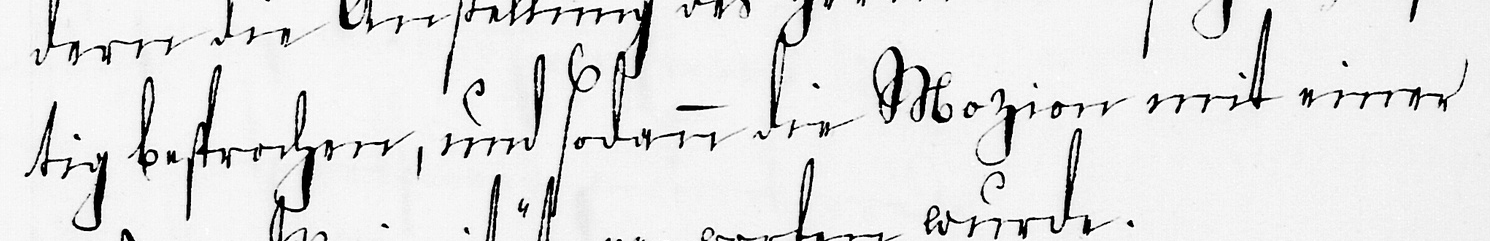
tig besprochen, und sodann die Mozion mit einer
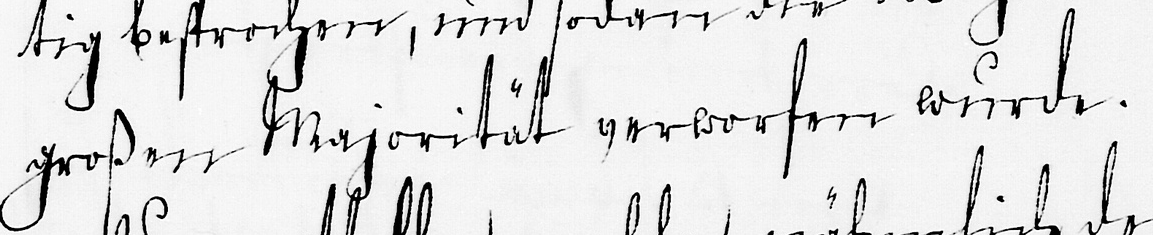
großen Majorität verworfen wurde.
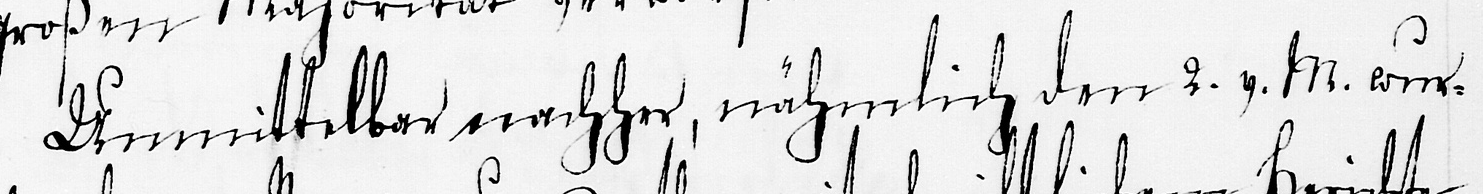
Unmittelbar nachher, nähmlich den 2. v. M. wur¬
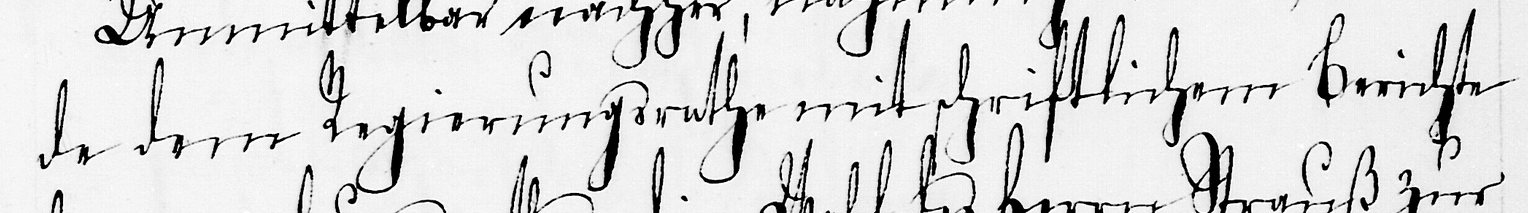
de dem Regierungsrathe mit schriftlichem Berichte
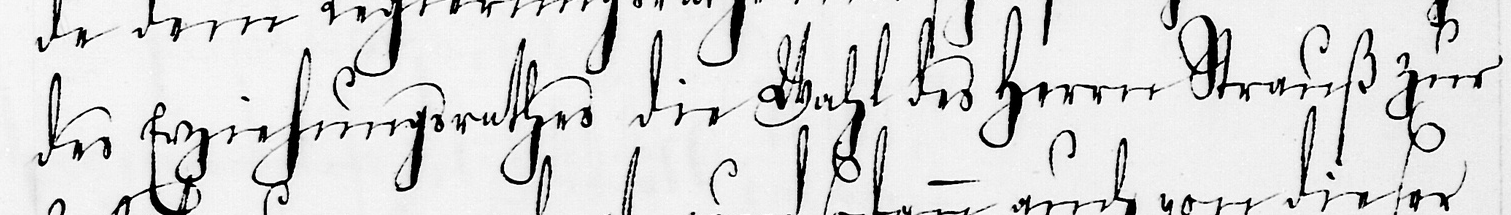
des Erziehungsrathes die Wahl des Herrn Strauß zur
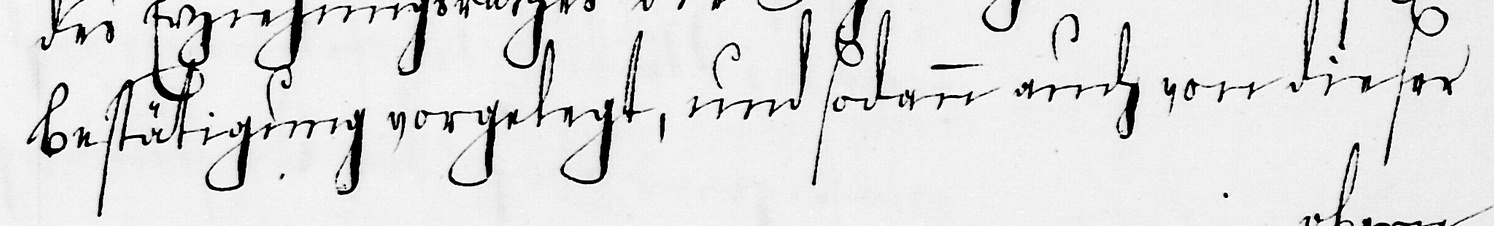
Bestätigung vorgelegt, und sodann auch von dieser
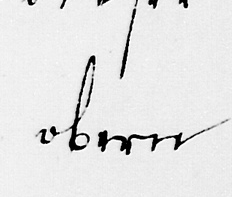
eine
